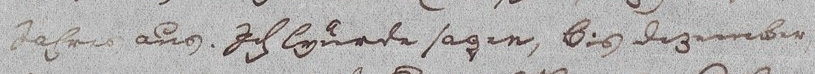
Jahres aus. Ich würde sagen, bis Dezember,
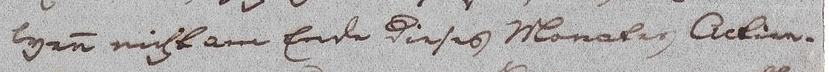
wenn nicht am Ende dieses Monates Actien- -
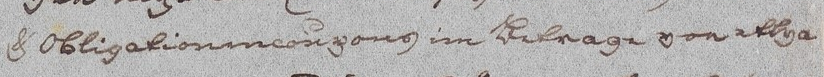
& Obligationencoupons im Betrage von etwa
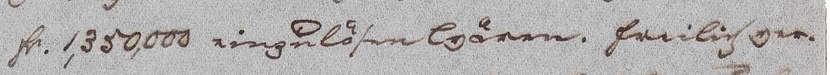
Fr. 1,350,000 einzulösen wären. Freilich ver-
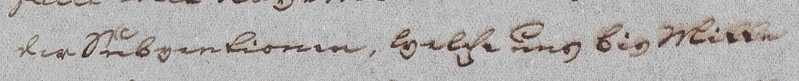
der Subventionen, welche uns bis Mitte
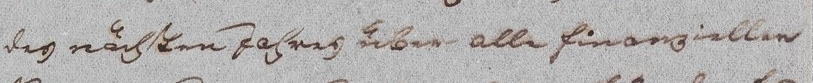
des nächsten Jahres über alle finanziellen
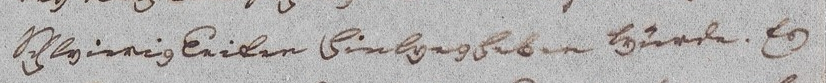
Schwierigkeiten hinwegheben würde. Es
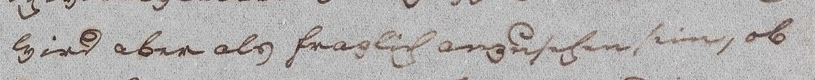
wird aber als fraglich anzusehen sein, ob
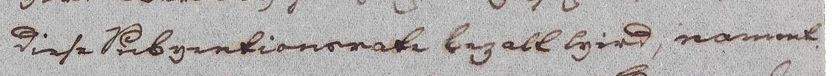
diese Subventionsrate bezalt wird, nament-
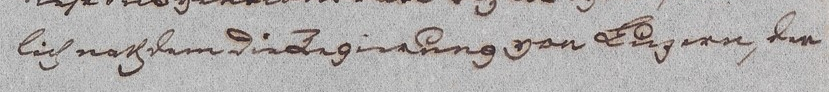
lich nachdem die Regierung von Luzern, der
